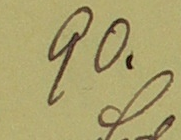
90
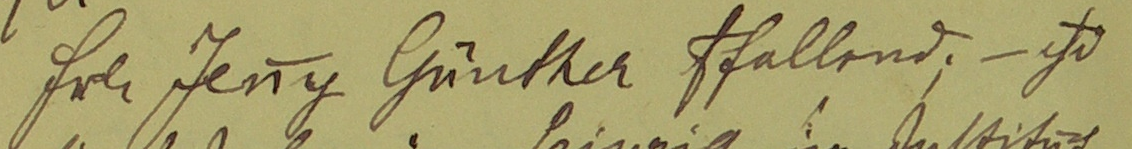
Frl. Jenny Günther auffallend;- nachdem
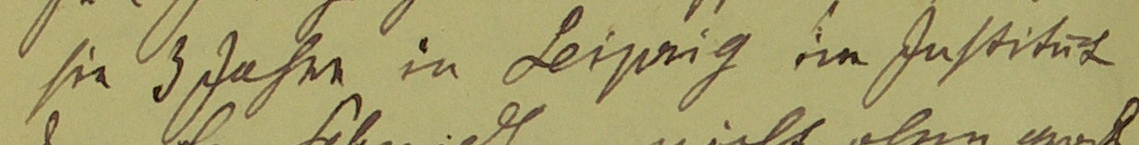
sie 3 Jahre in Leipzig im Institut
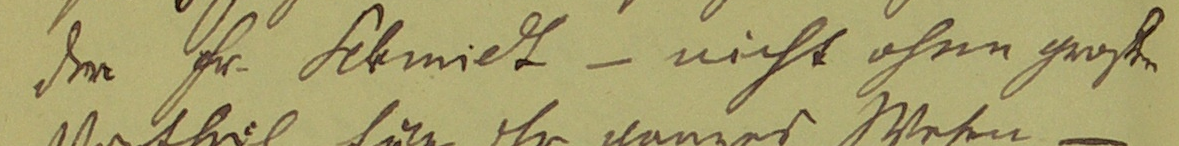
der Fr. Schmidt - nicht ohne großen
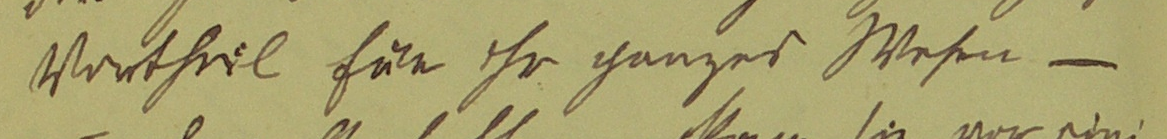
Vorteil für ihr ganzes Wesen –
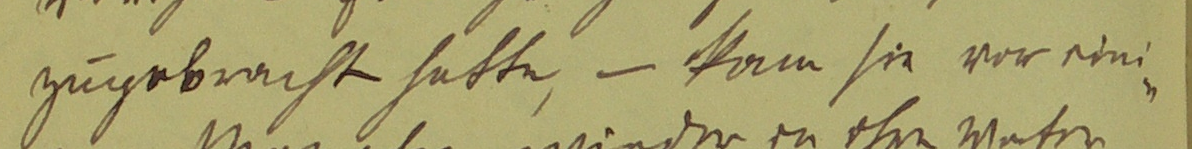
zugebracht hatte,- kam sie vor eini¬
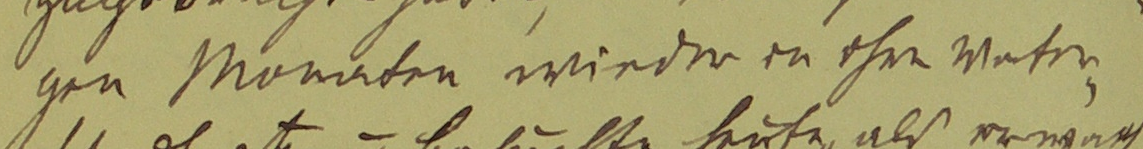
gen Monaten wieder in ihre Vater¬
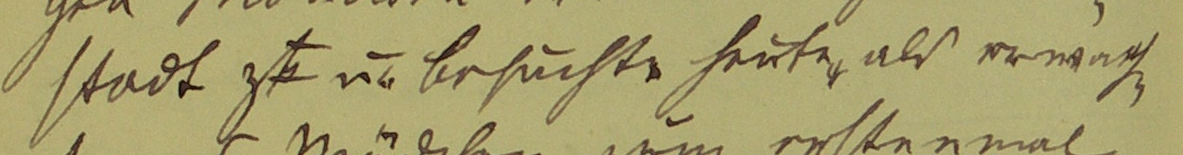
stadt zurück und besuchte heute als erwach¬
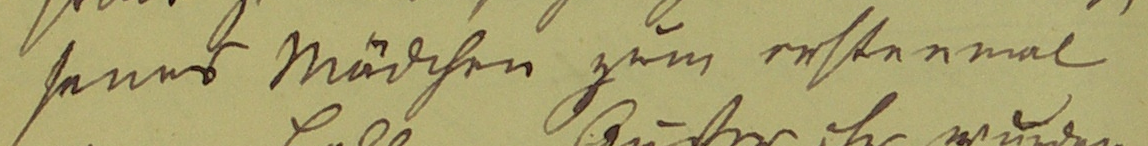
senes Mädchen zum erstenmal
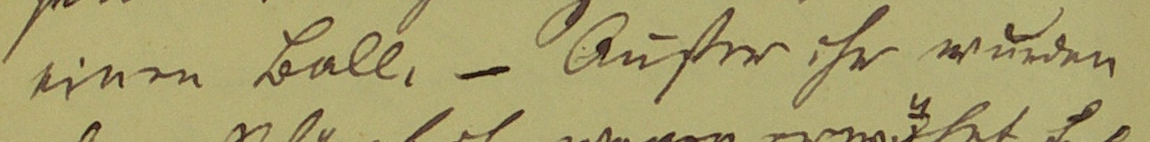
einen Ball.- Außer ihr wurden
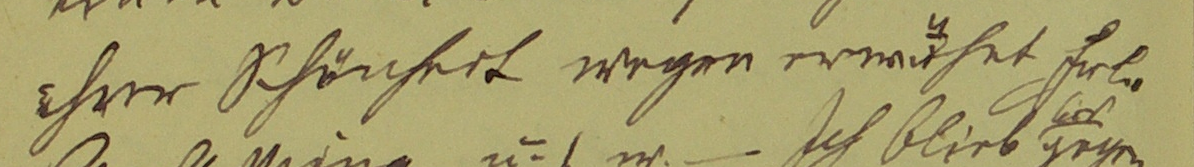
ihrer Schönheit wegen erwähnt Frl.
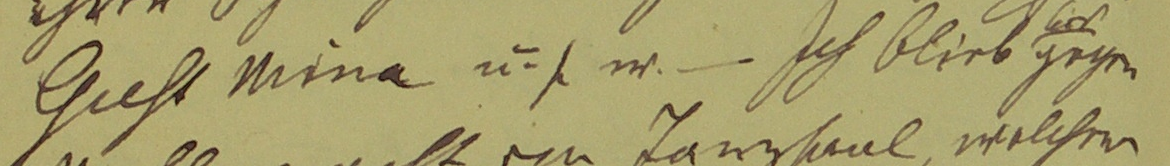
Guth Mina u.s.w. - Ich blieb bis gegen
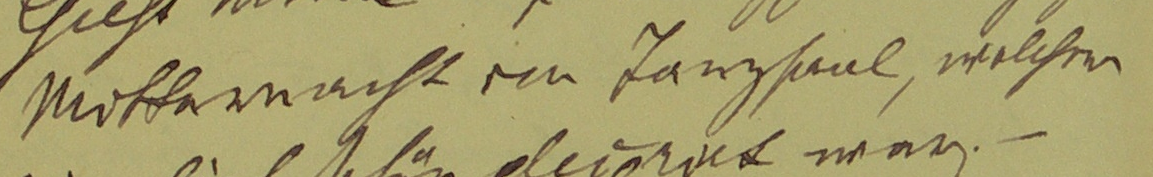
Mitternacht im Tanzsaal, welcher
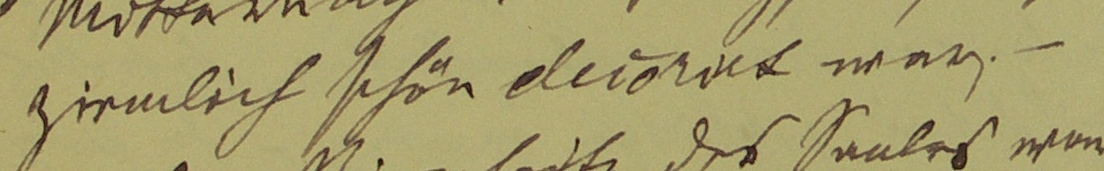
ziemlich schön decoriert war.-
